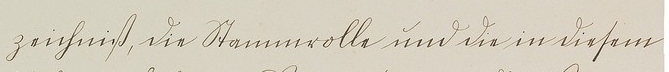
zeichniß die Stammrolle und die in diesem
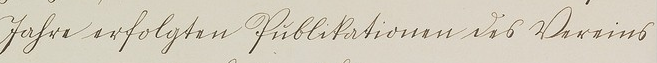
Jahre erfolgten Publikationen des Vereins
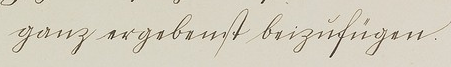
ganz ergebenst beizufügen.
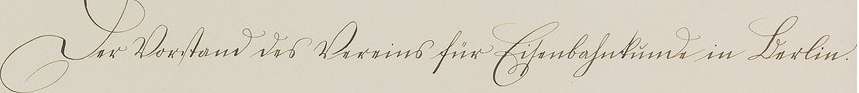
Der Vorstand des Vereins für Eisenbahnkunde in Berlin.
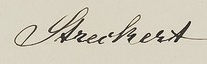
Streckert
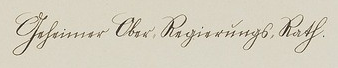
Geheimer Ober-Regierungs-Rath.
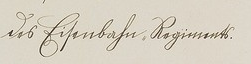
des Eisenbahn-Regiments.
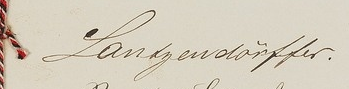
Lantzendörffer.
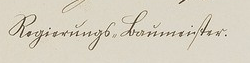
Regierungs-Baumeister.
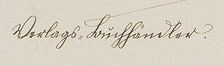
Verlags-Buchhändler.
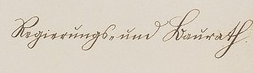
Regierungs- und Baurath.
